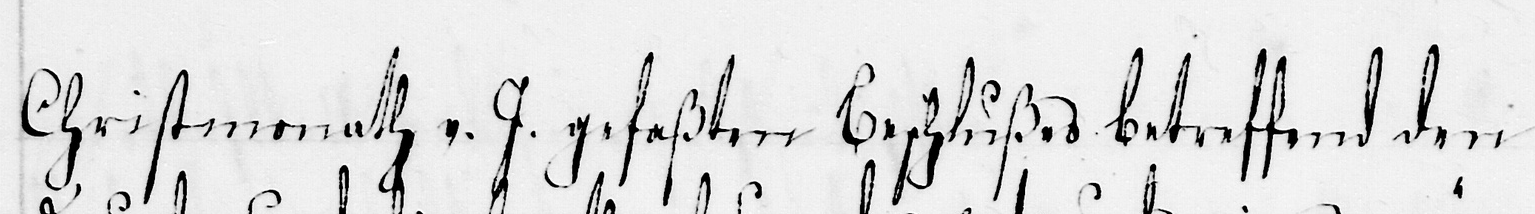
Christmonath v. J. gefaßten Beschlußes betreffend den
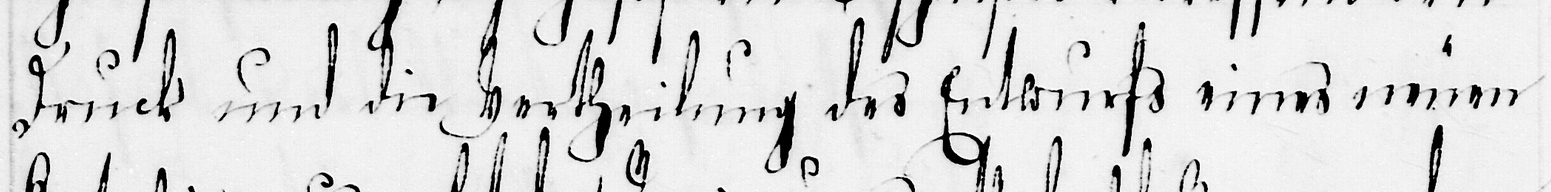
Druck und die Vertheilung des Entwurfs eines neuen
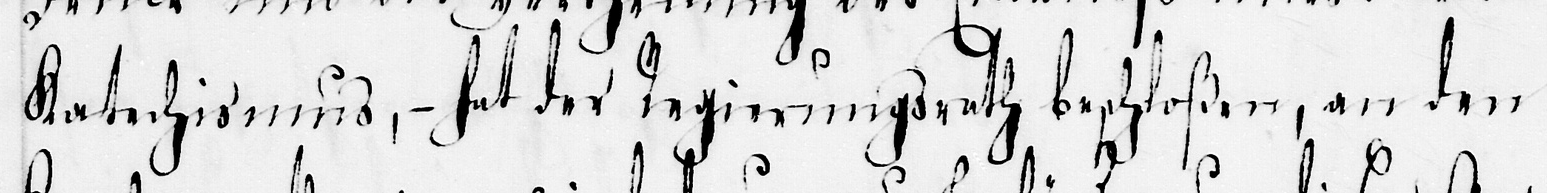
Katechismus, – hat der Regierungsrath beschloßen, an den
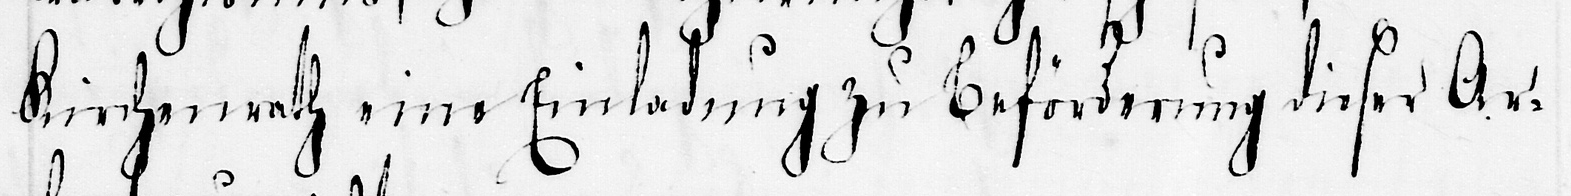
Kirchenrath eine Einladung zu Beförderung dieser Ar¬
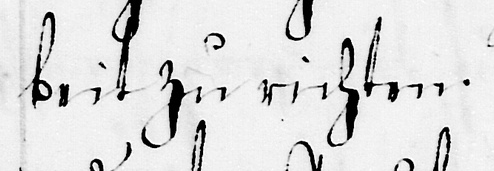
beit zu richten.
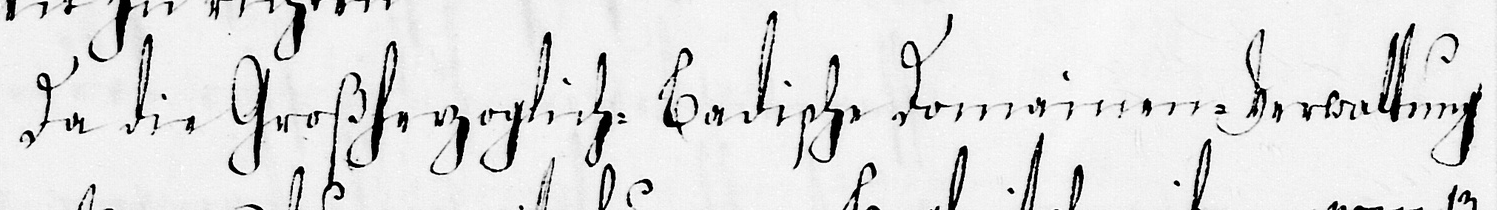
Da die Großherzoglich-Badische Domainen-Verwaltung
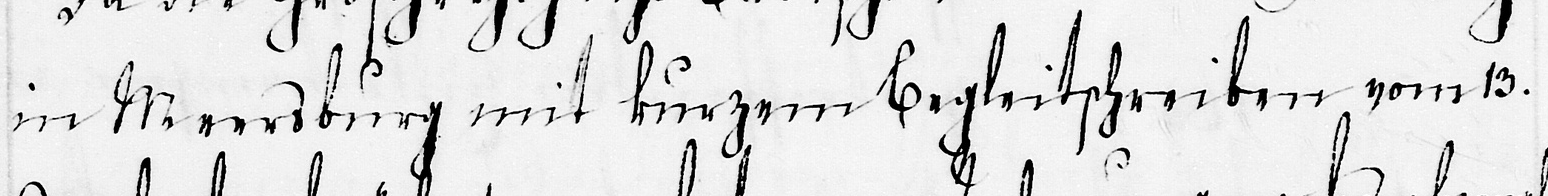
in Meersburg [sic!] mit kurzem Begleitschreiben vom 13.
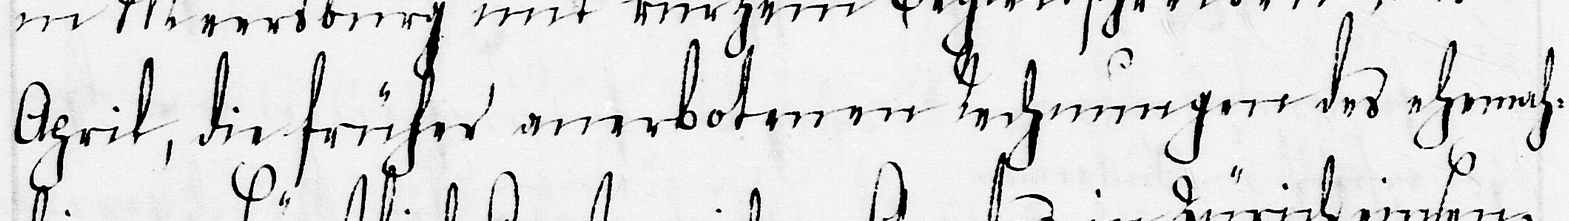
April, die früher anerbotenen Rechnungen des ehemah¬
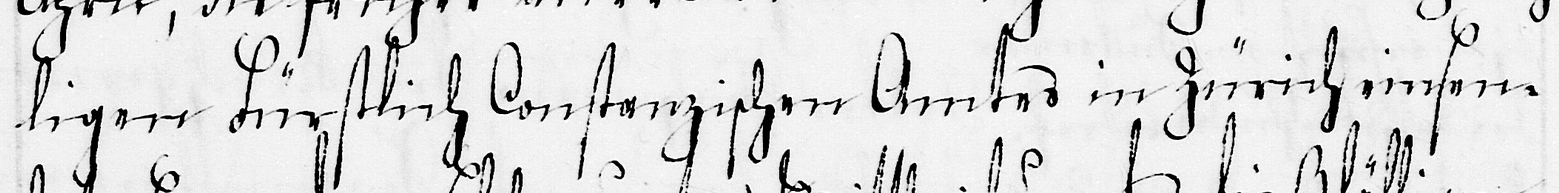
ligen Fürstlich Constanzischen Amtes in Zürich einsen¬
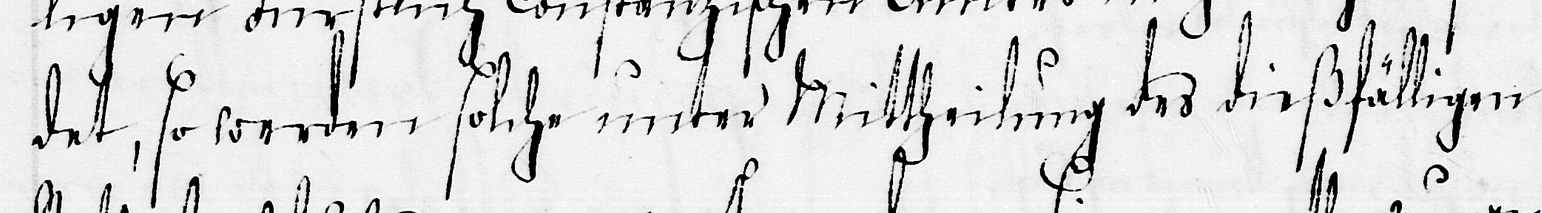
det, so werden solche unter Mittheilung des dießfälligen
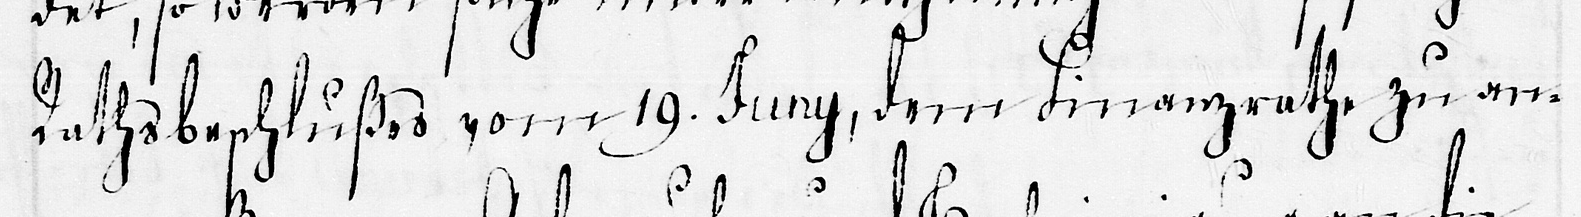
Rathsbeschlußes vom 19. Juny, dem Finanzrathe zu an¬
